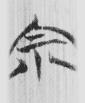宗
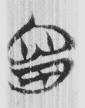{宀苗}
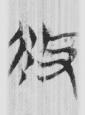攸
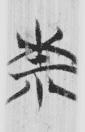{木示}
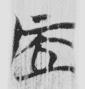{厂立}
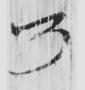乃
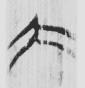大
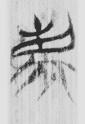廌
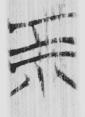{示工}
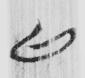㠯（以）
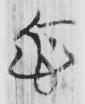忻
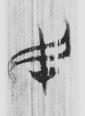民
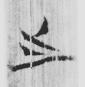之
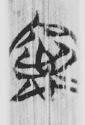{穴心皿}
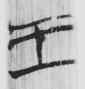王
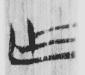乍
